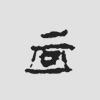皿
